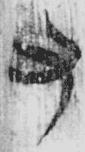又（有）
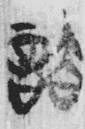詓（訟）
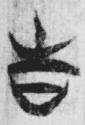告
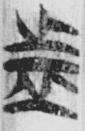者
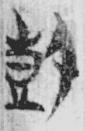○（鼓）
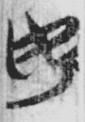𡚦（焉）
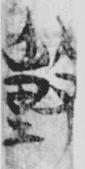○（撞）
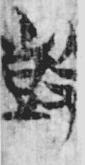○（鼓）
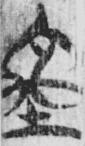○（禹）
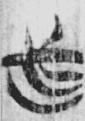必
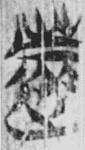速
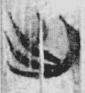出
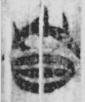冬
